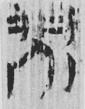○（蓋）
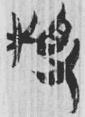○（相）
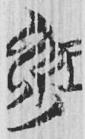○（徙）
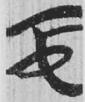𠁩
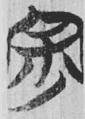余（舍）
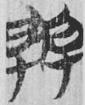與
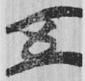五
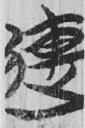連
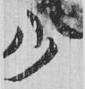少（小）
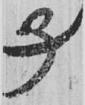子
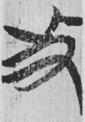及
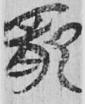龍（寵）
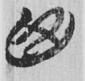臣
